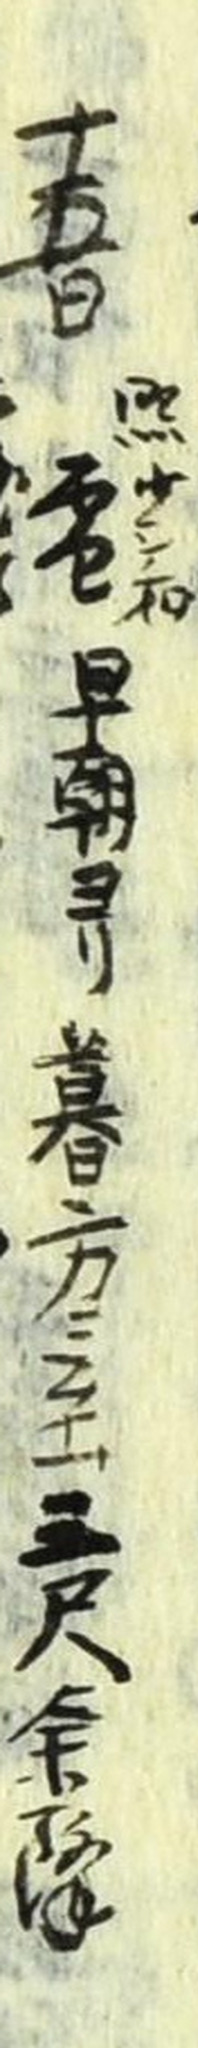十五日雪早朝ヨリ暮方ニ至五尺余降
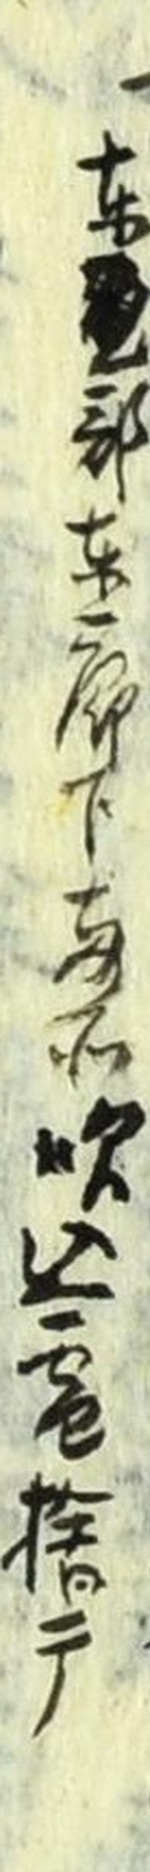東屋部東廊下両所吹込雪捨テ
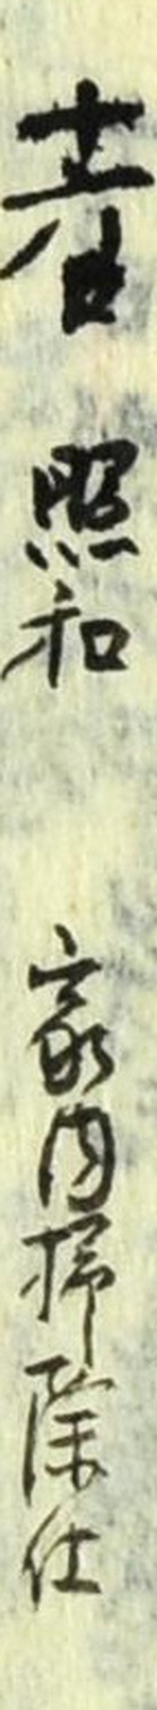十六日照和家内掃除仕
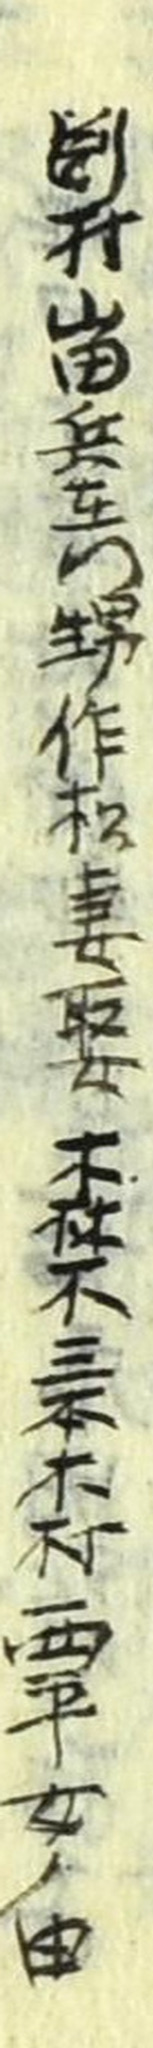淵村山田兵在門甥作松妻娶森木三本木村西平女ノ由

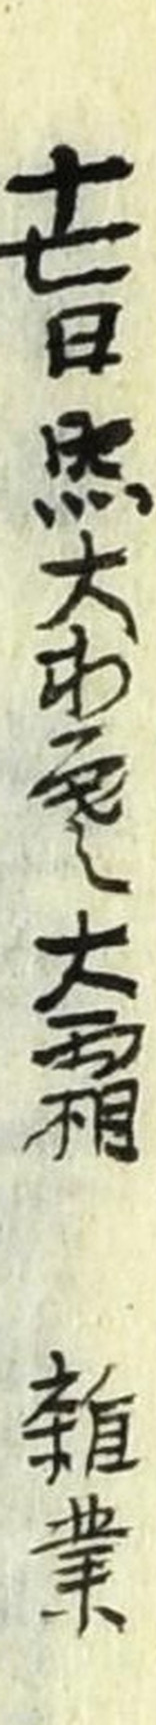十七日照大氷寒大霜雑業
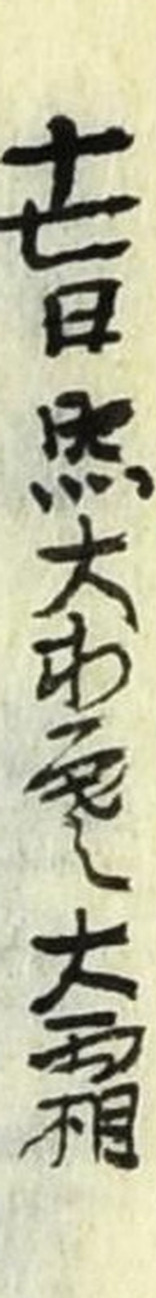十七日照大氷寒大霜雑業
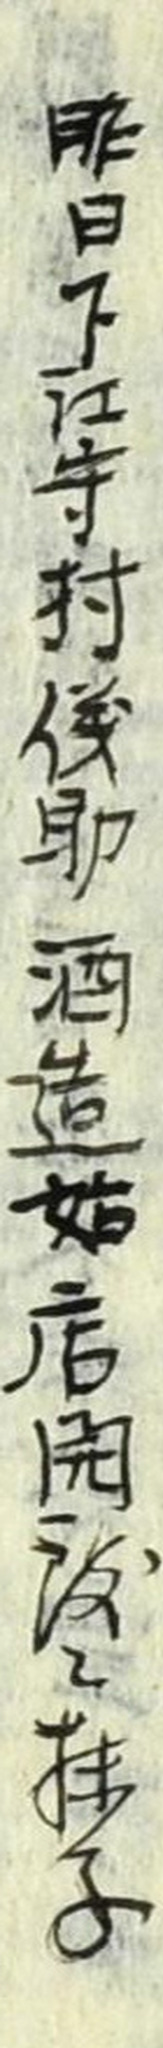昨日下江守村儀助酒造始店開致候様子
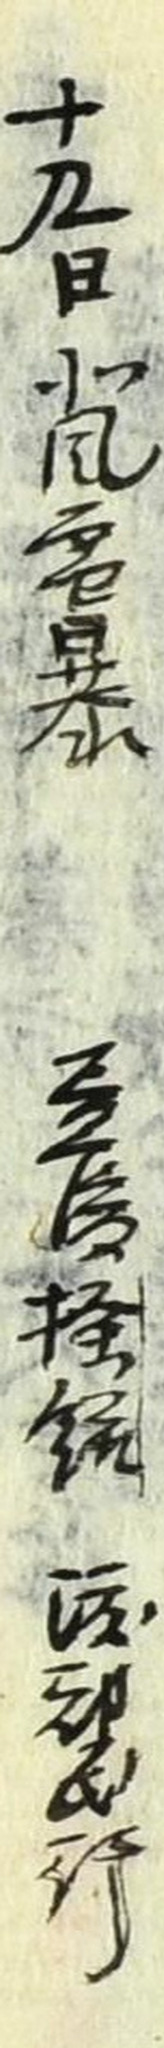十九日北風雪暴昼後掻統渡部氏行
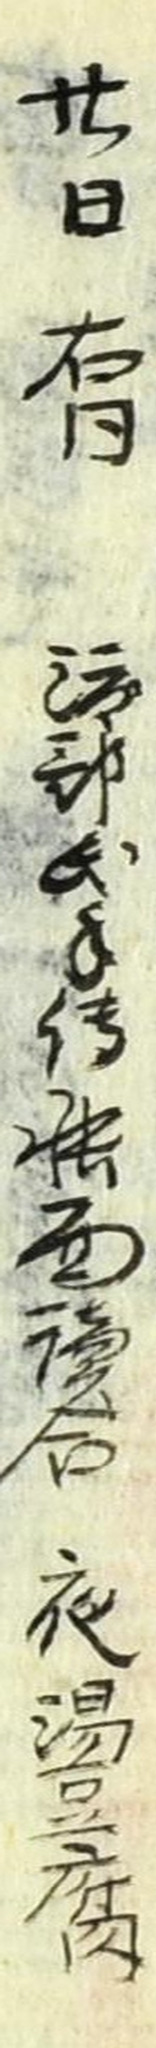廿日右同渡部氏手伝帳面読合夜湯豆腐
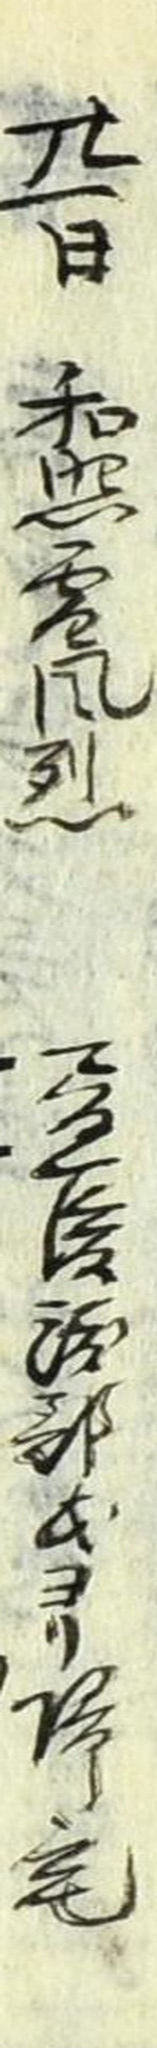廿一日和照雪風烈昼後渡部氏ヨリ帰宅
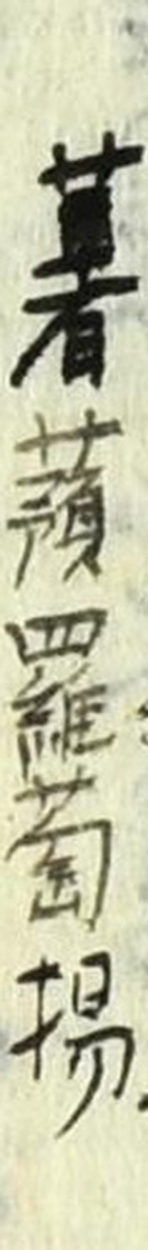薯蕷羅萄揚
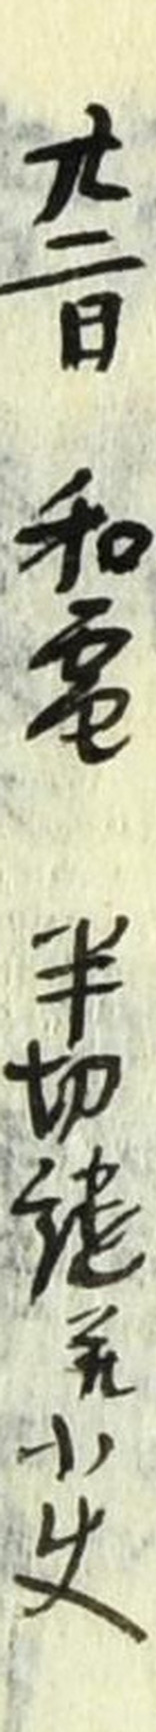廿二日和雪半切継并小使
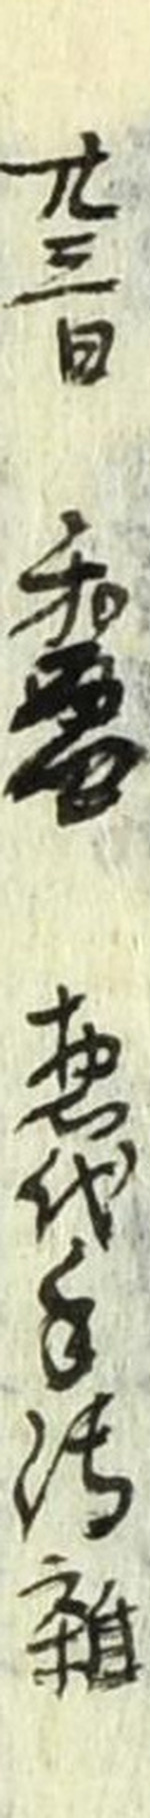廿三日和雪惣代手伝雑
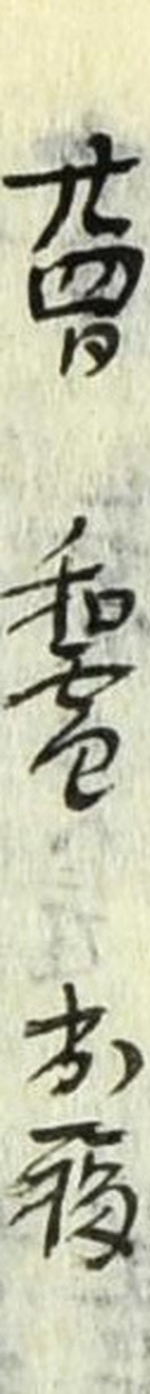廿四日和雪出福
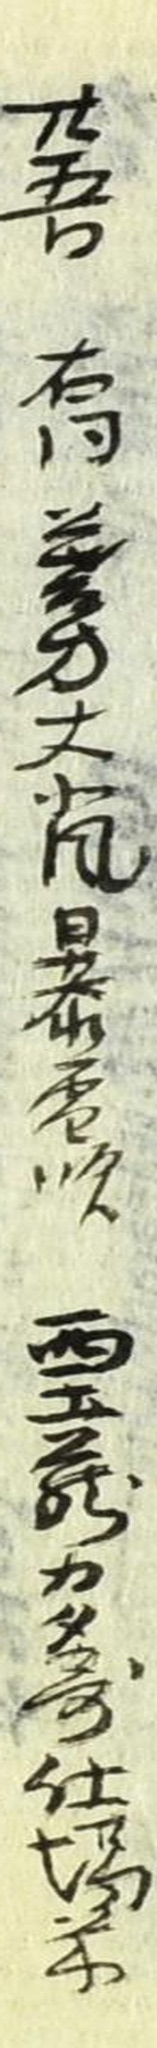廿五日右同暮方大嵐暴雪吹西土蔵カタ寄仕場米
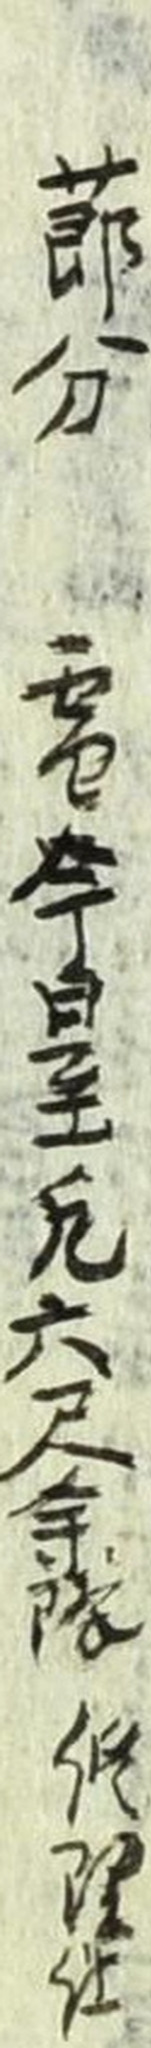節分雪今日至凡六尺余降修理仕
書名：（日記）
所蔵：福井県文書館 Fukui Prefectural Archives
